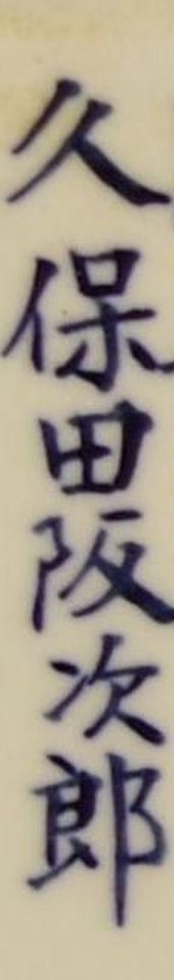久保田阪次郎
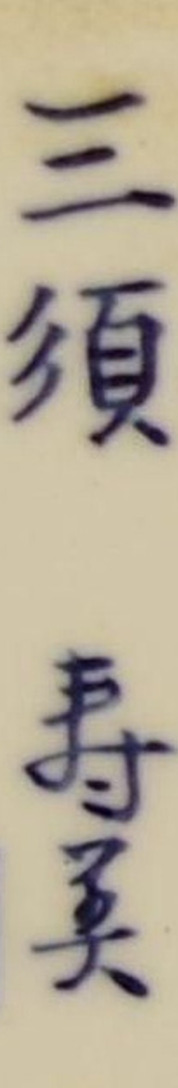三須寿美
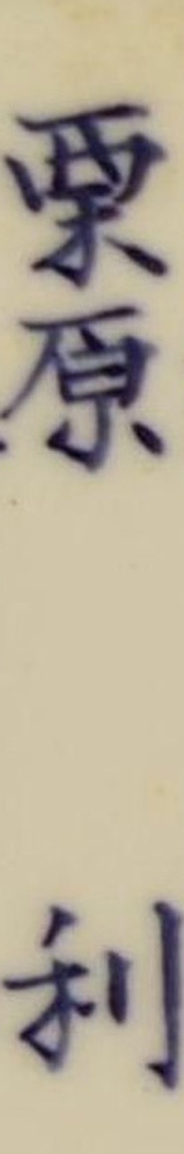栗原利
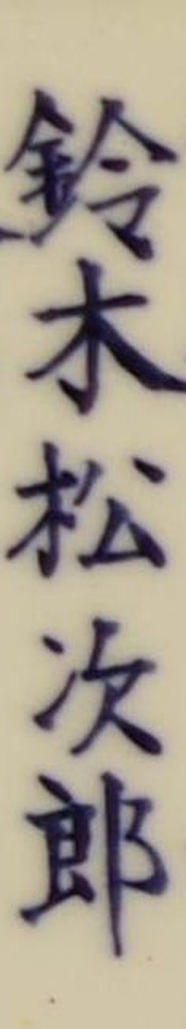鈴木松次郎
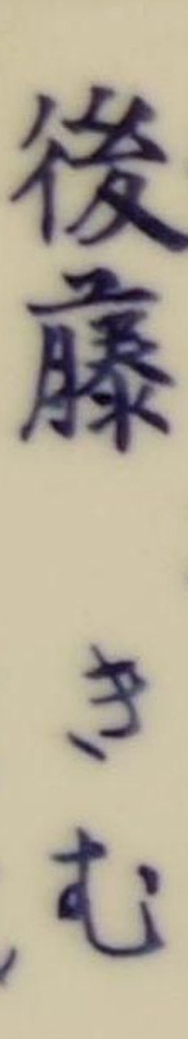後藤きむ
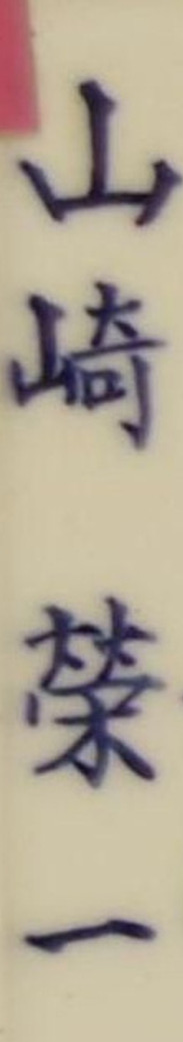山崎榮一

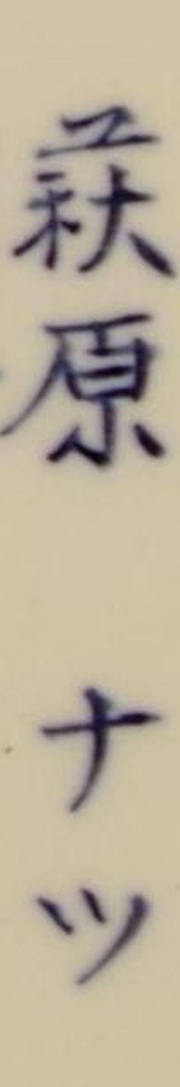萩原ナツ
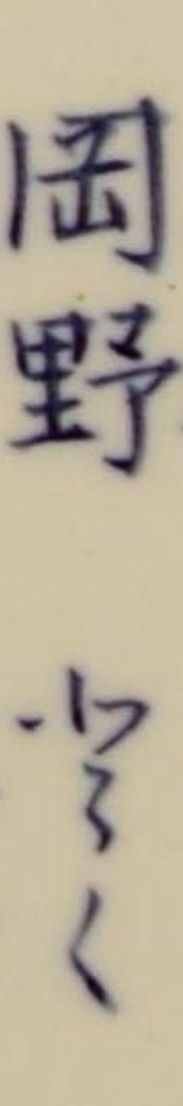岡野とく
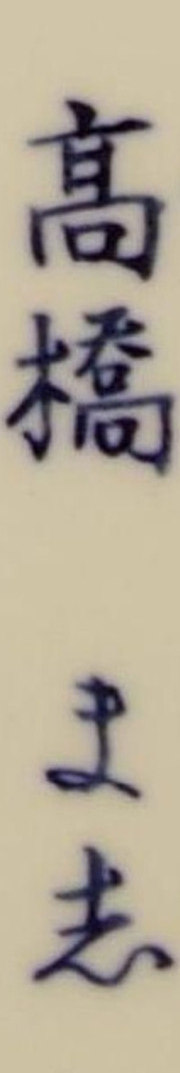高橋まし
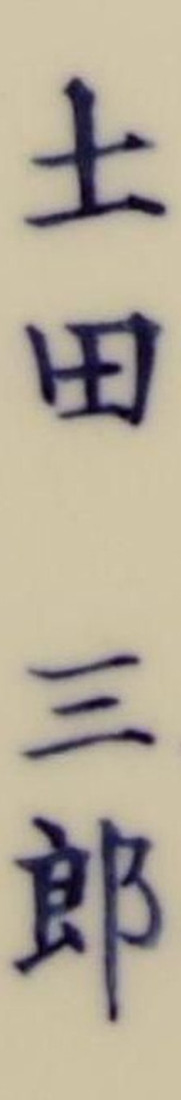土田三郎
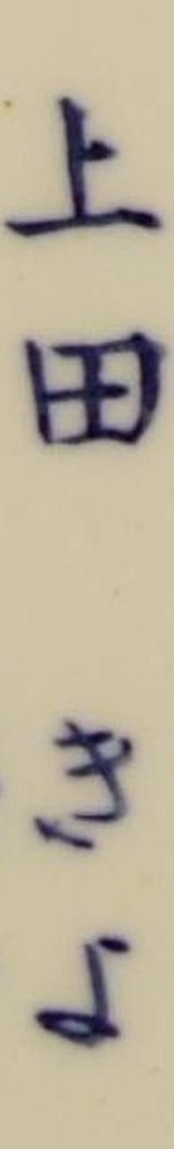上田きよ
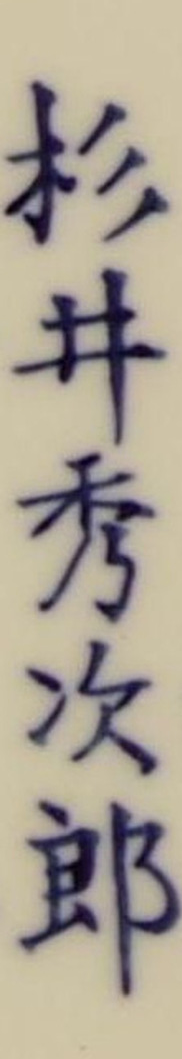松井秀次郎
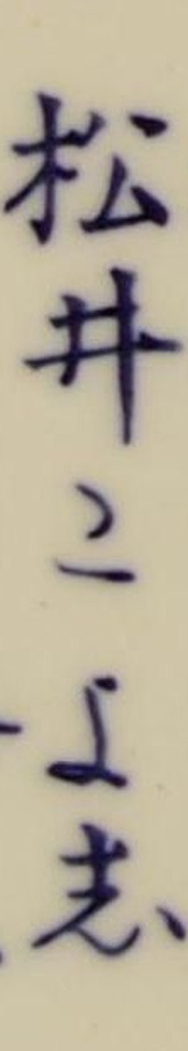松井こよし
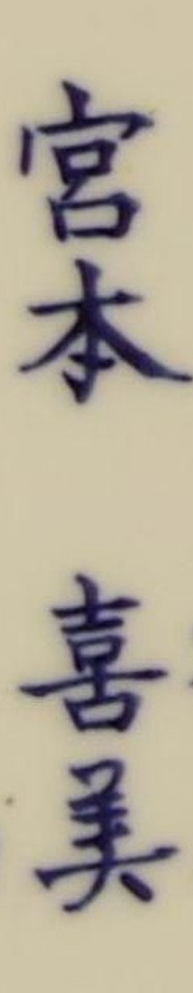宮本喜美
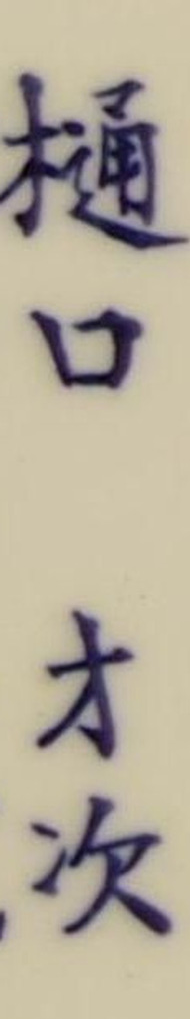樋口才次
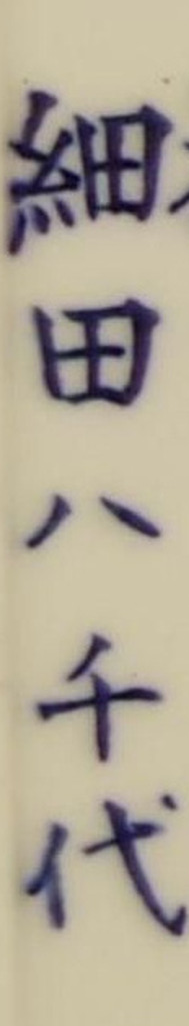細田八千代
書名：E~L
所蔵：高野山金剛峯寺
